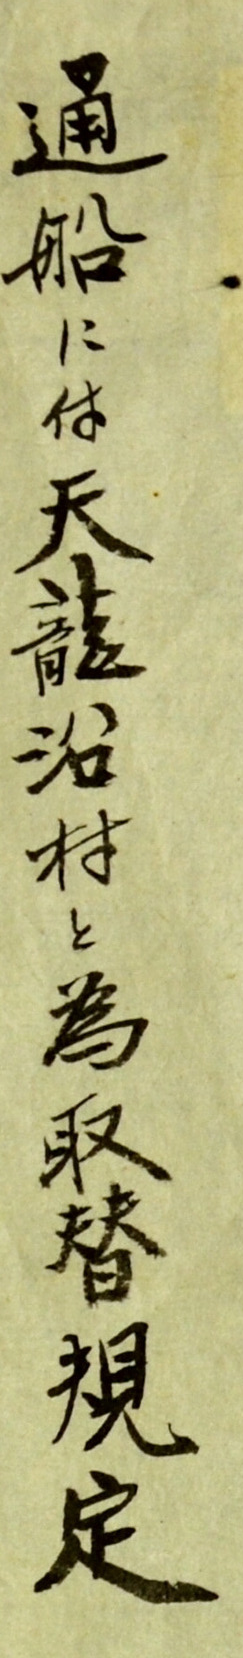通船に付天龍沿村と為取替規定
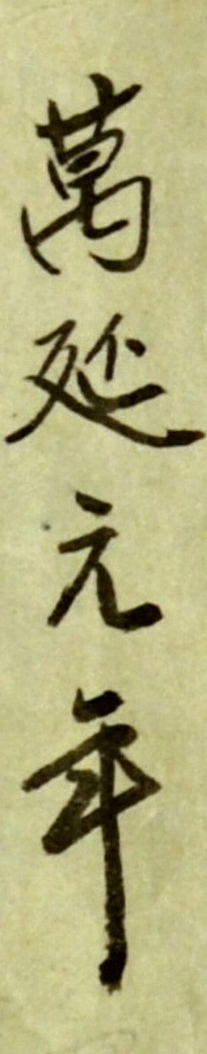万延元年
